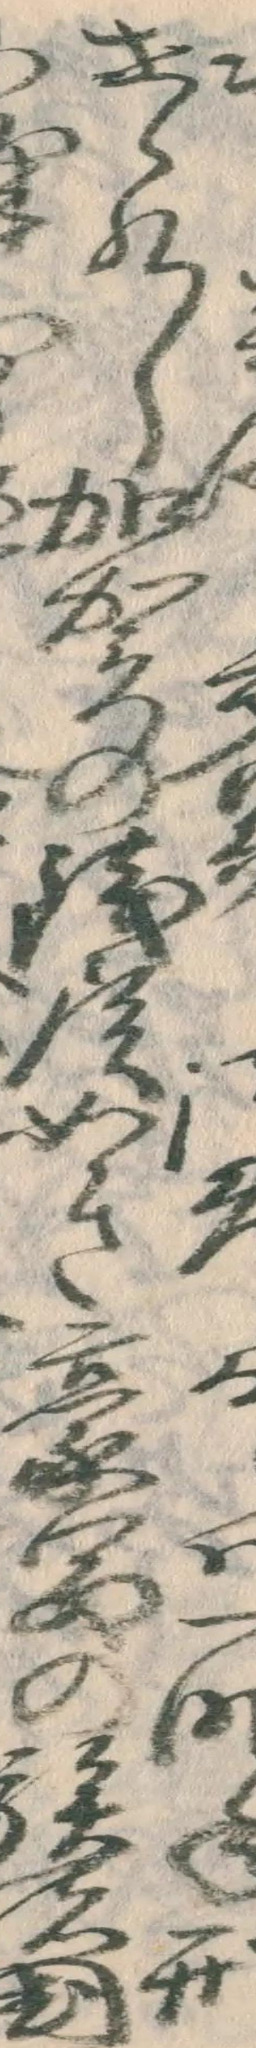せられし加賀の銭屋如き豪富の族諸国
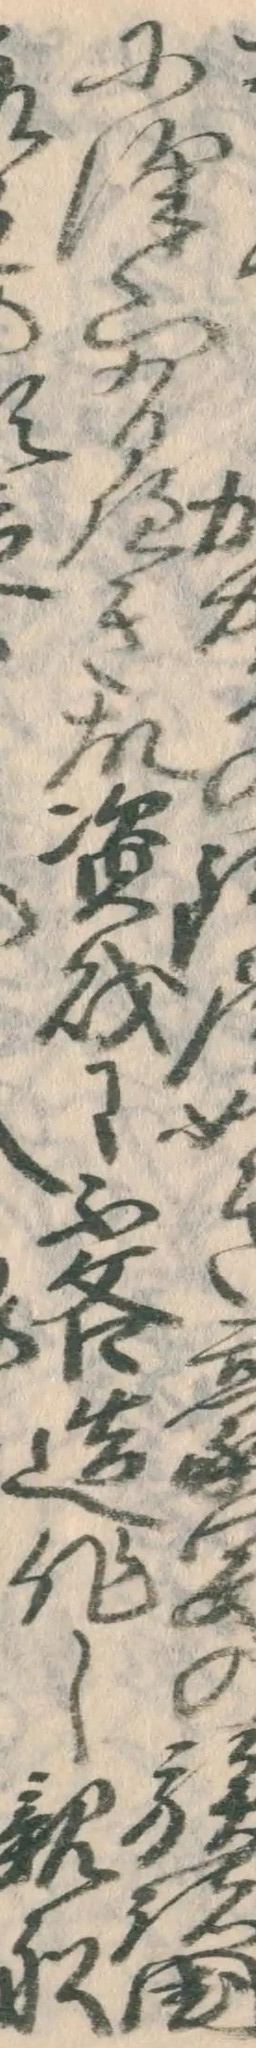に澤山有へき故資財に不吝造作し親船
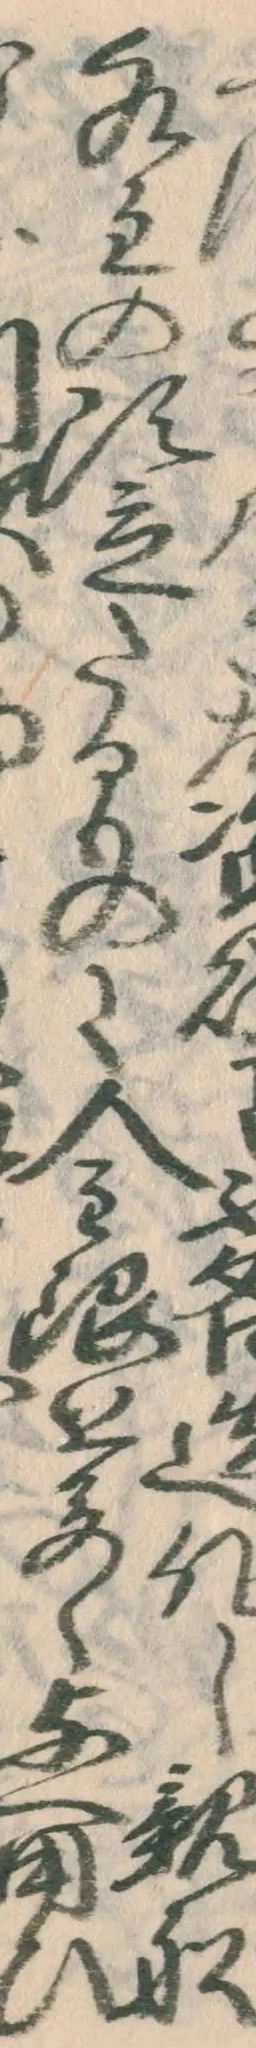水主の頭立たるものに金銀を多く与へ用ひ
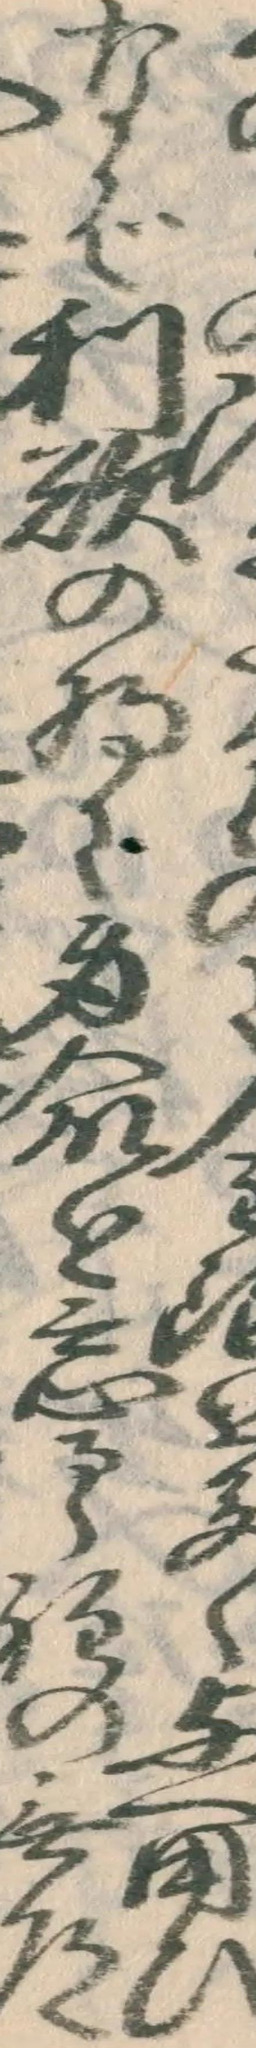なば利欲の為に身命を忘るヽ程の無道
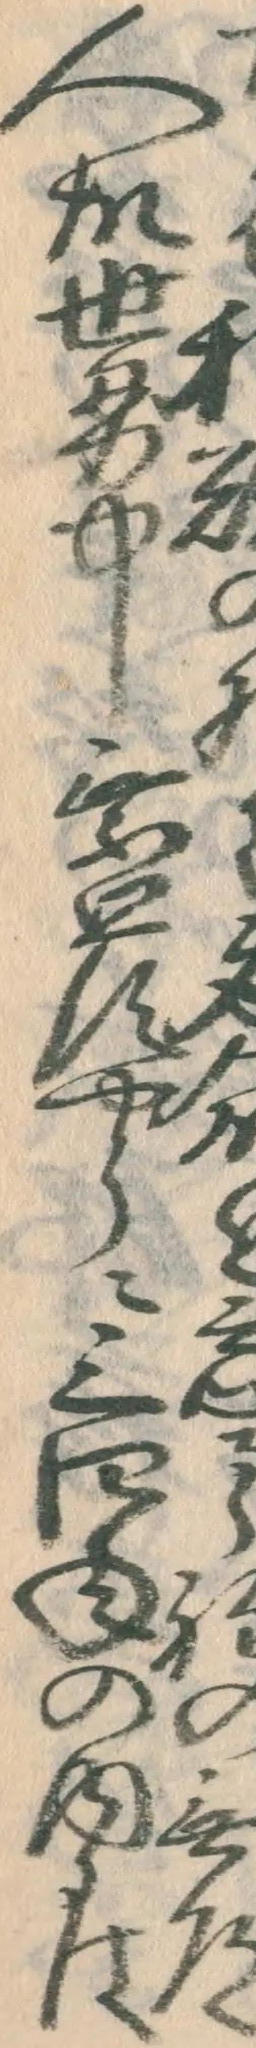人故世界中乗廻すやうニ三四年の内には

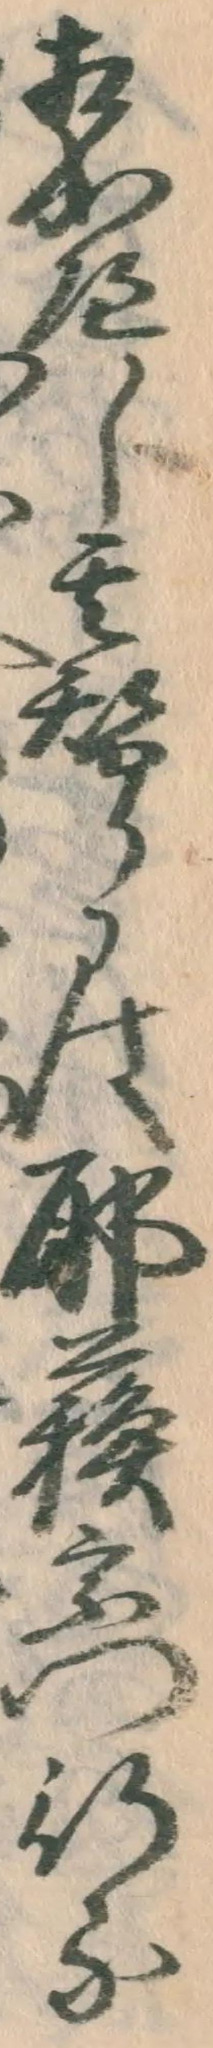相成へし其替りには耶蘇宗門行る
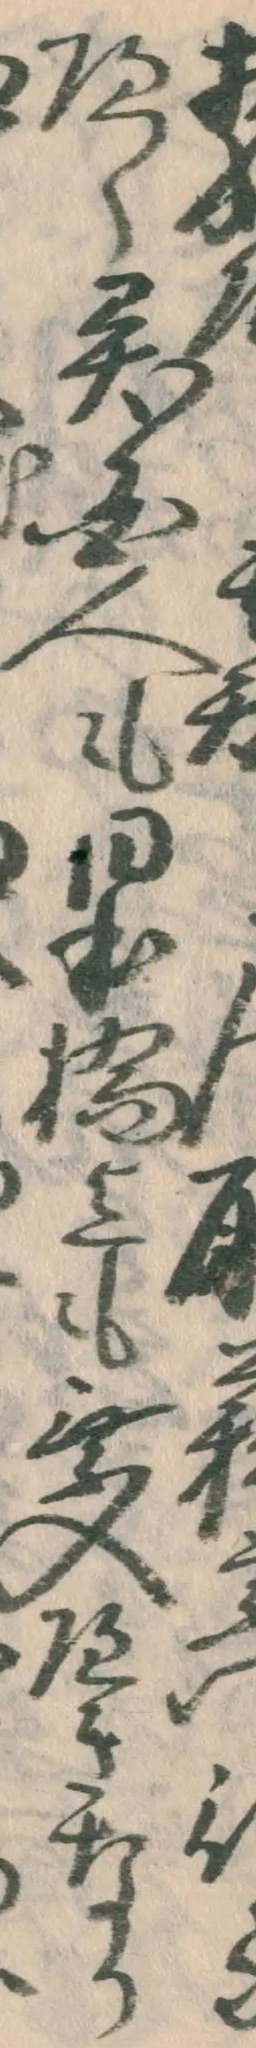へし異国人も日本橋迄も乗入へきなり
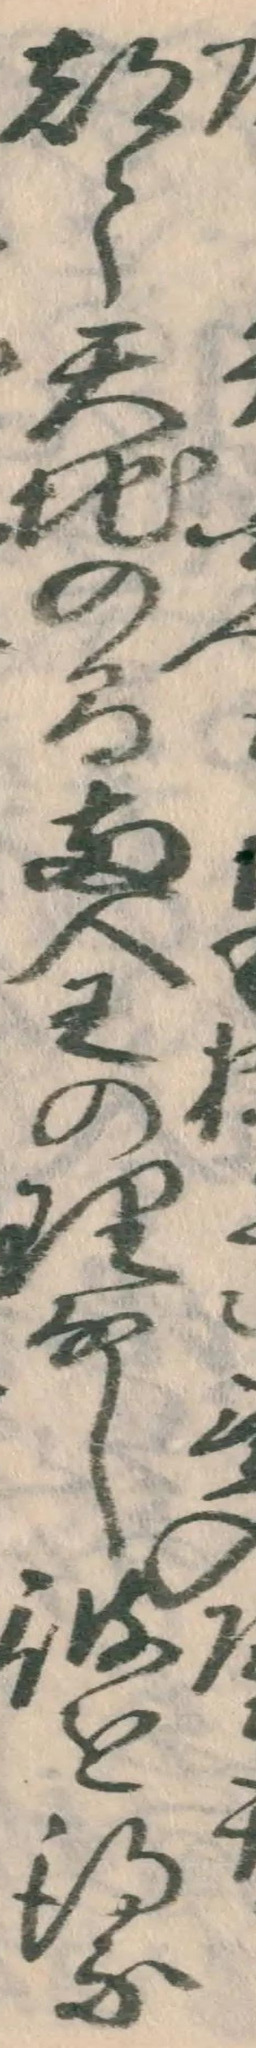都て天地の間両全の理なし彼を得る
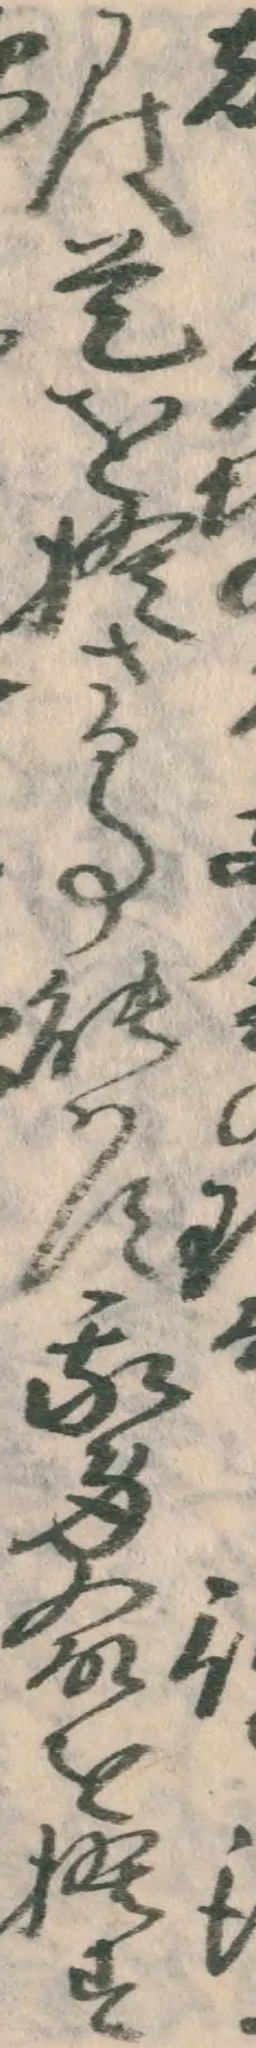には是を捨さる事能ハす我身命を捨す
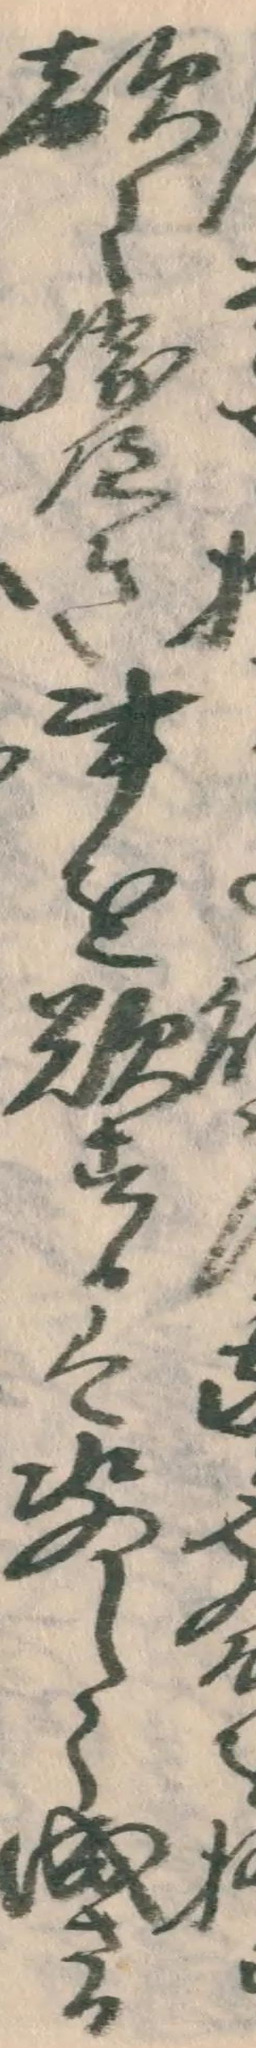敵に勝へき事を欲するは決して成さる
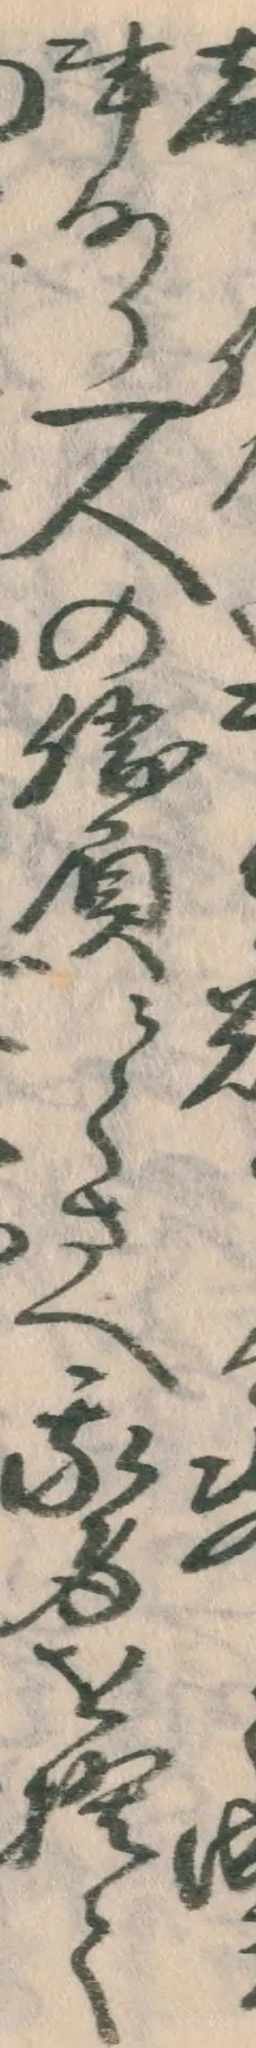事なり一人の勝負ニてさへ我身を捨て
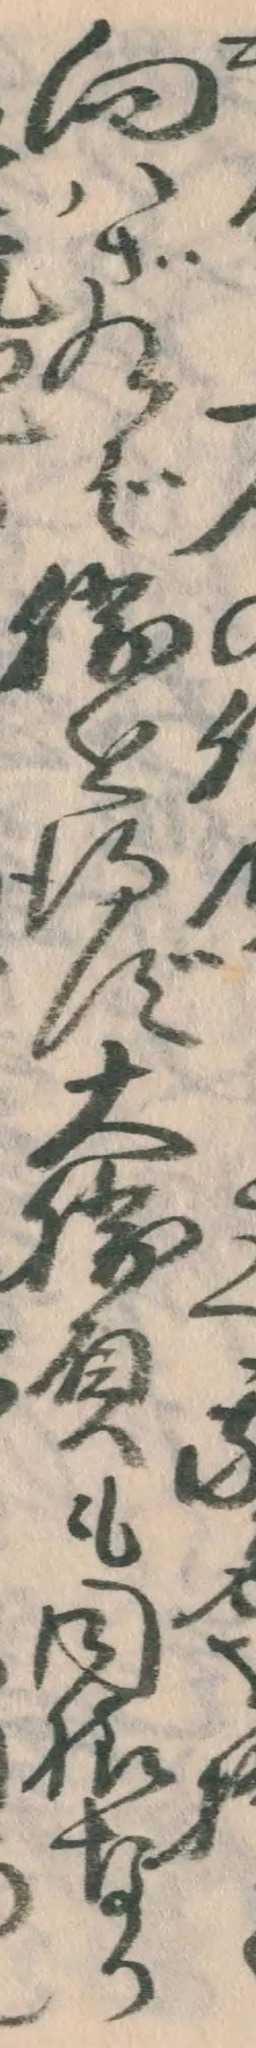向ハざれば勝を得ず大勝負も同様なり
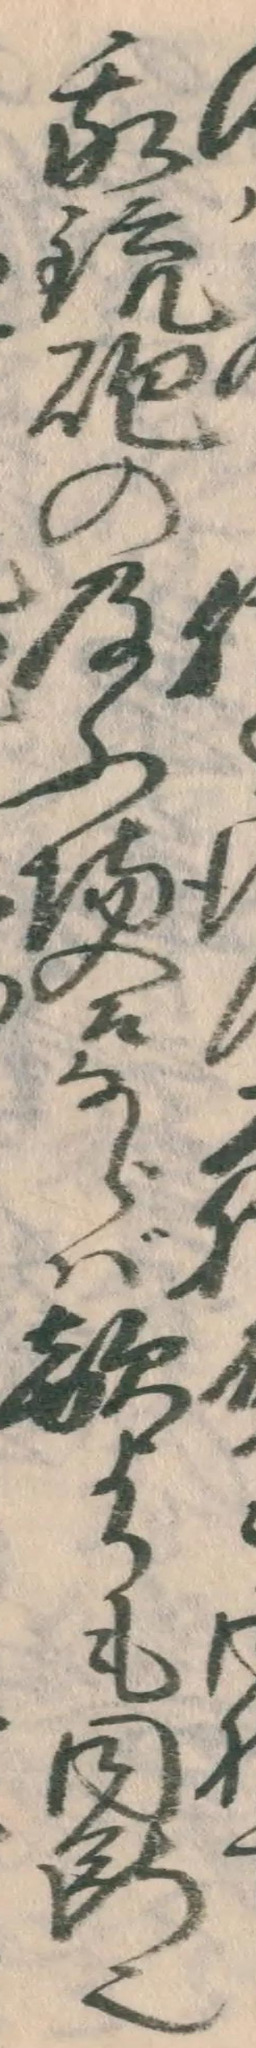我銃砲の及ふ場合ならバ敵よりも同断也
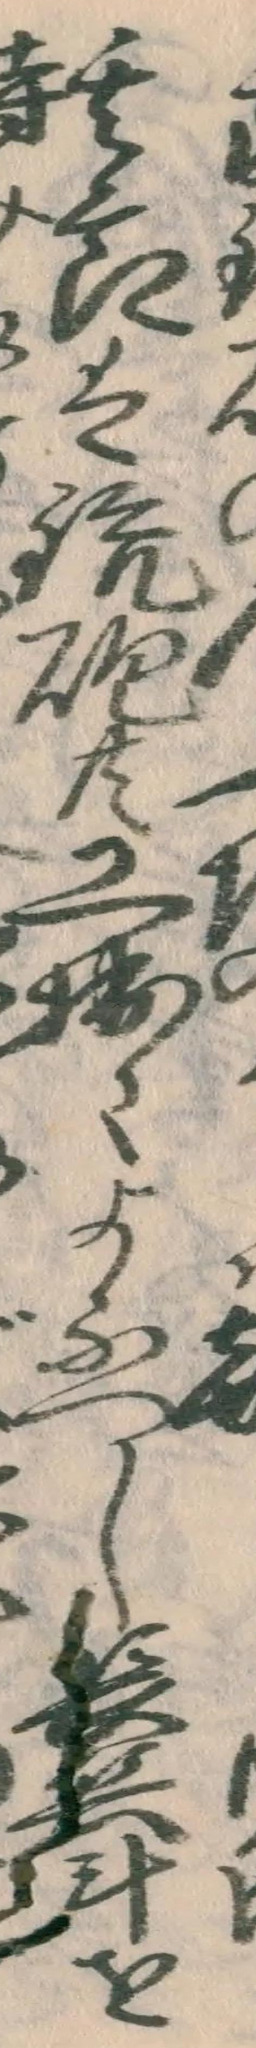其節は銃砲共工拙によるへし長兵斗を
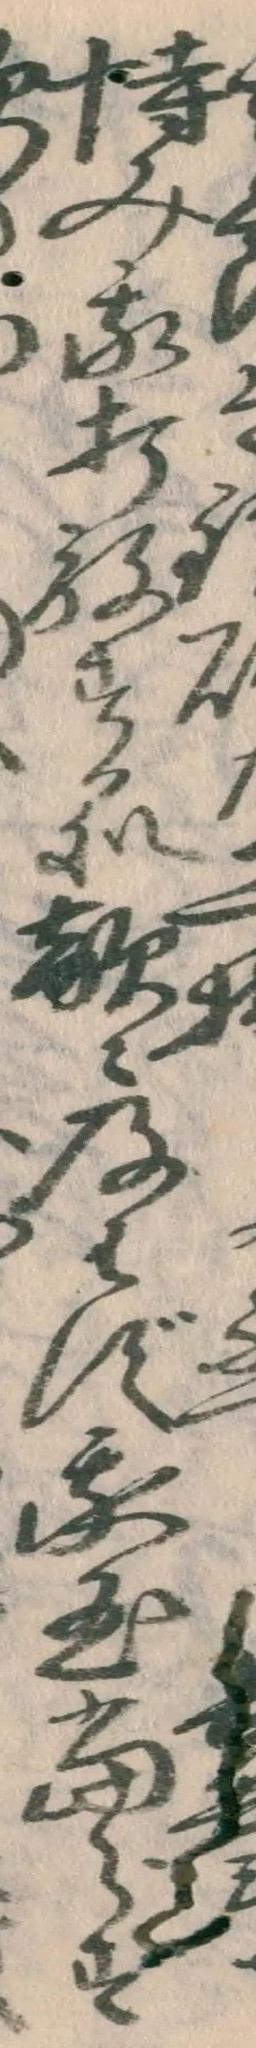恃み我打放する処敵ニ及はず我玉當らす
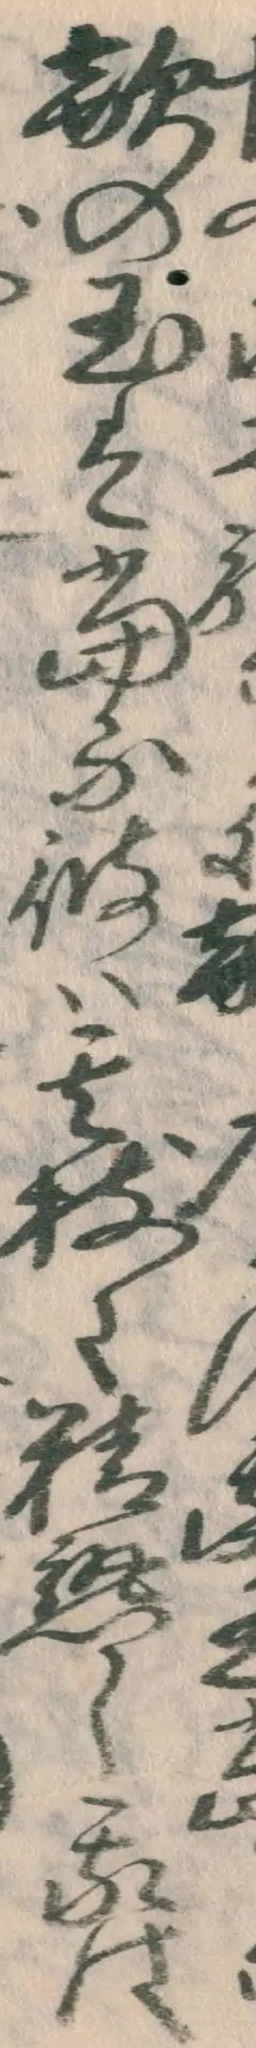敵の玉は當る彼ハ其技に精熟し我は
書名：麗斎叢書. 20
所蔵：国立国会図書館 National Diet Library, JAPAN
